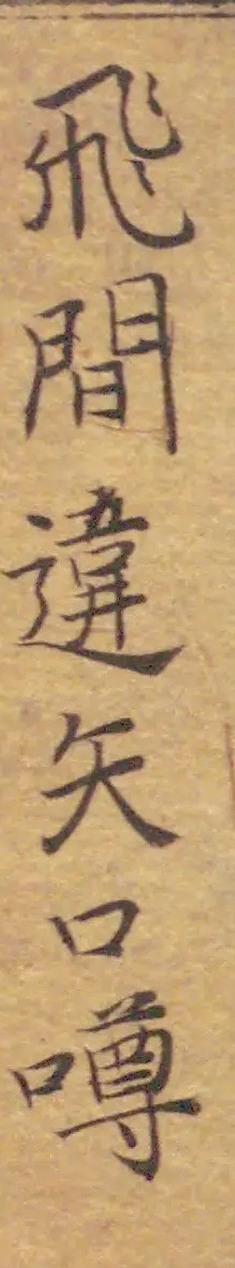飛間違矢口噂完
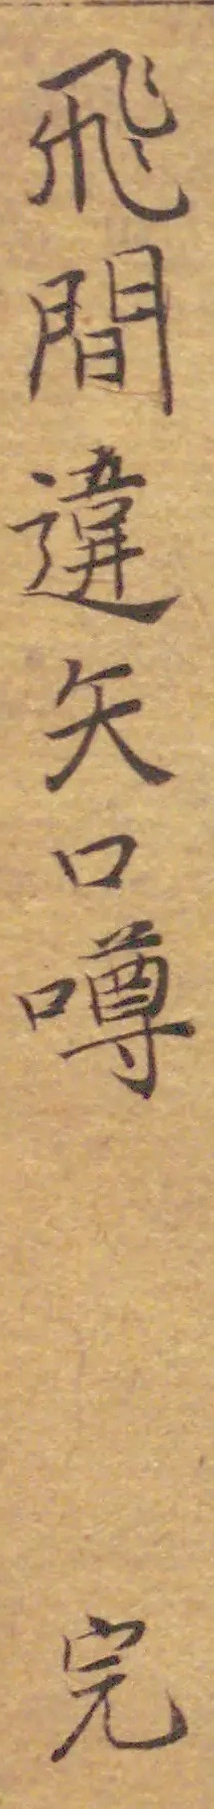飛間違矢口噂完

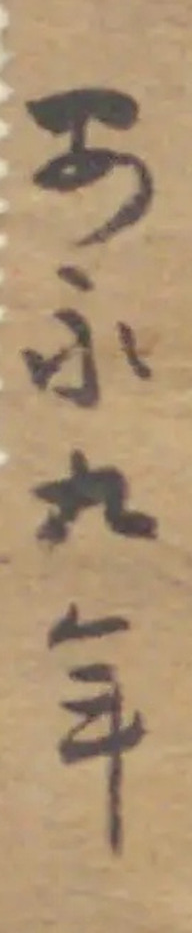安永九年

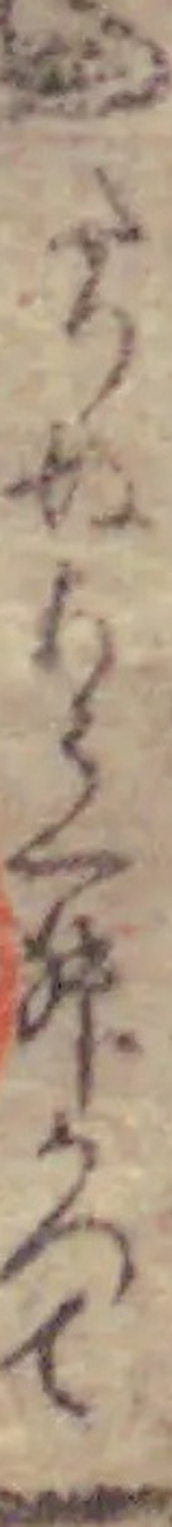たりぬもう一升かつて
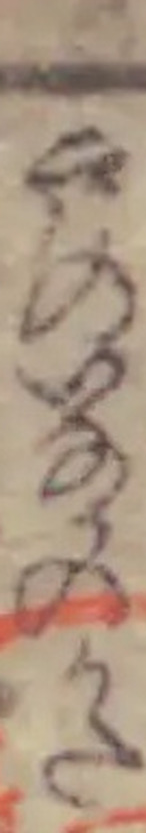戸のいなかのかた
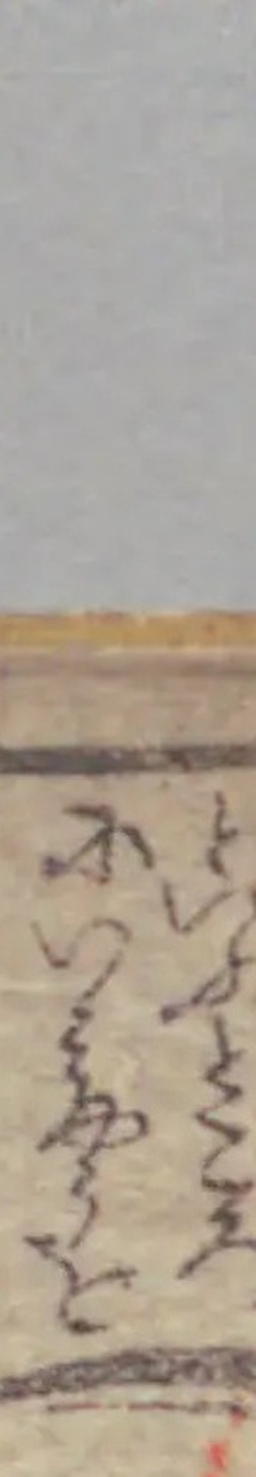にいみやうを
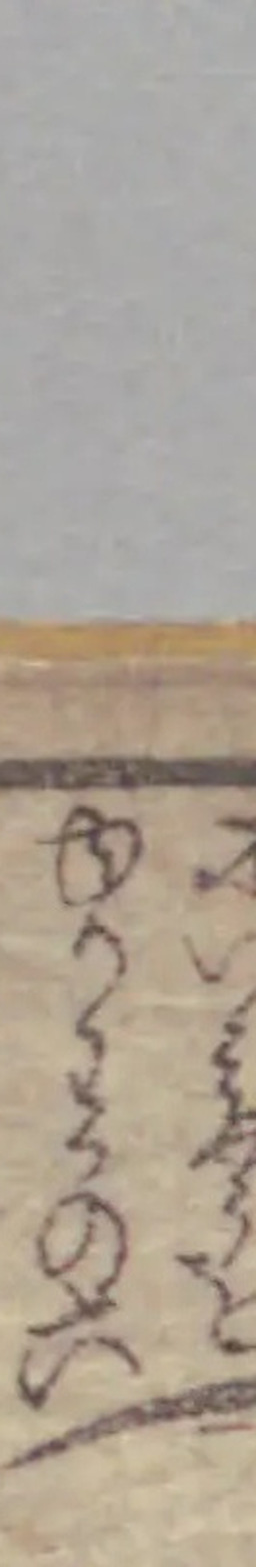ゆりわかの六
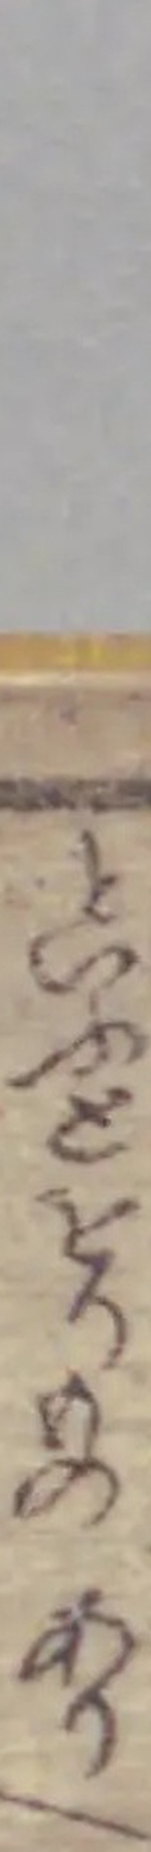といふとをりものあり
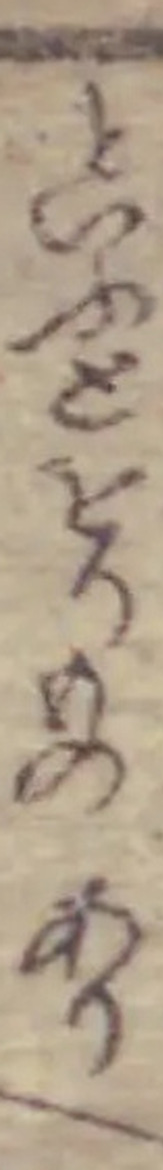といふとをりものあり
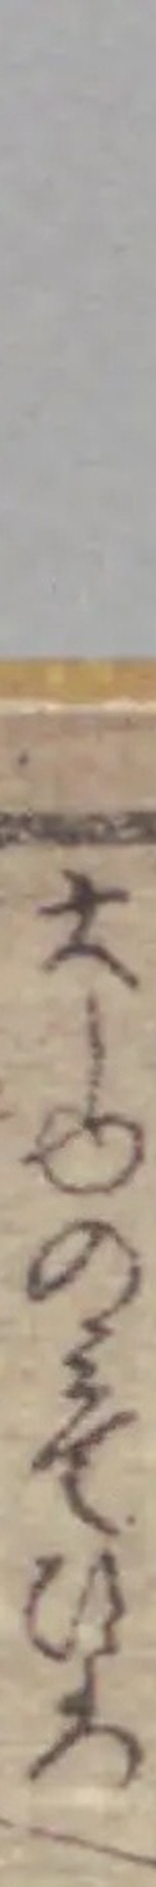大しゆのみてひよつ
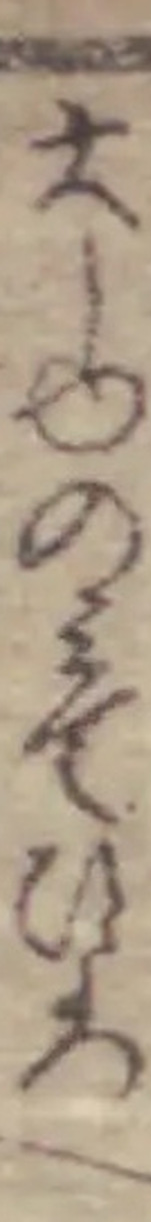大しゆのみてひよつ
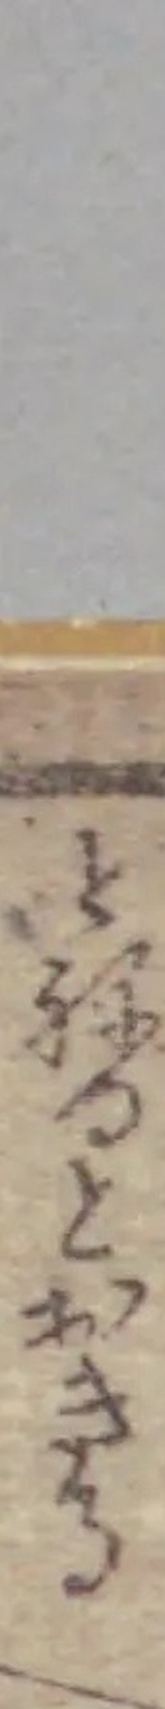とねるとおきる
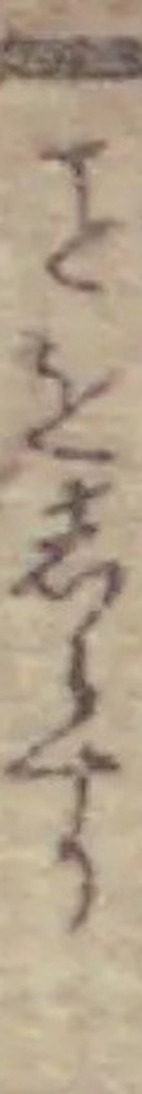ことをしらす
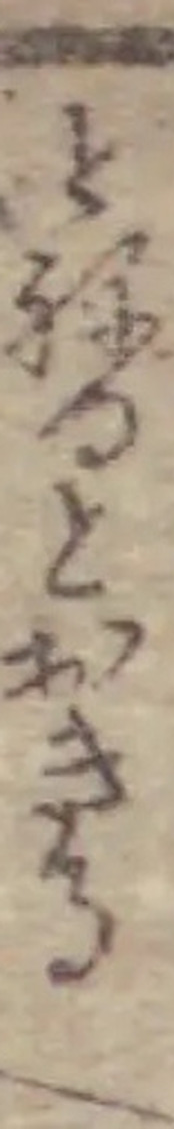とねるとおきる
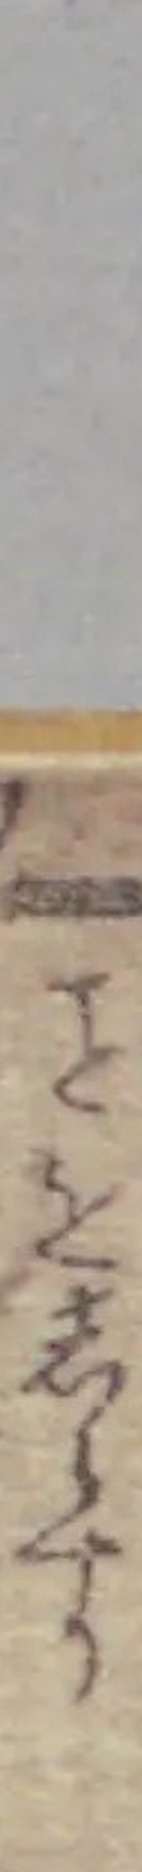ことをしらす
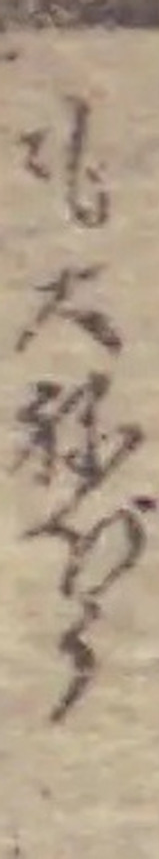も大ねぼう
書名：飛た間違矢口噂 2巻
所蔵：国立国会図書館 National Diet Library, JAPAN
